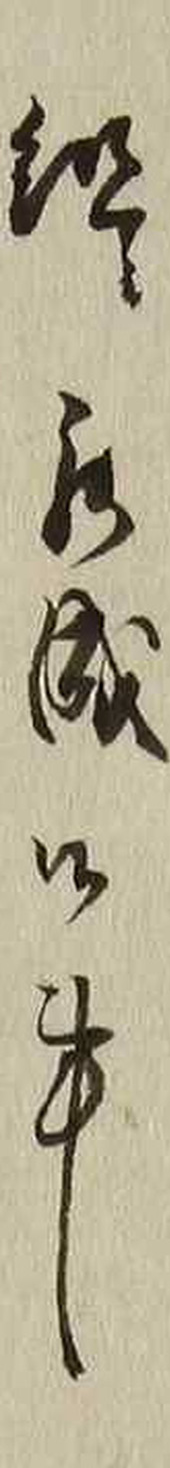組ニ罷成候事
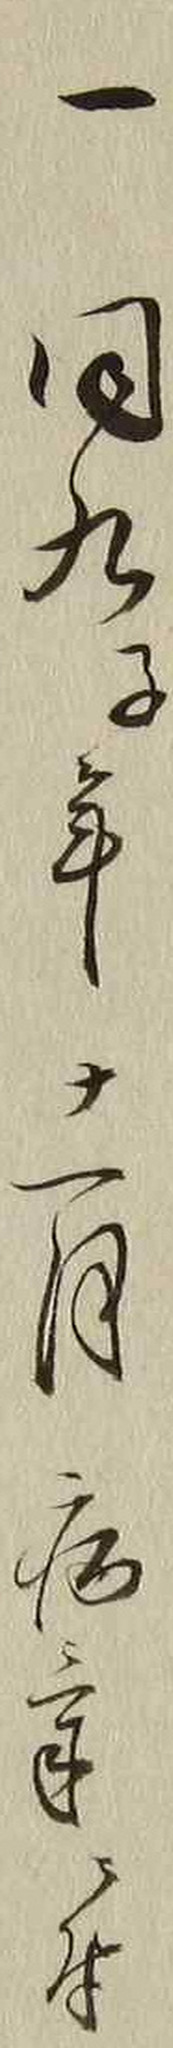一同九子年十一月病気ニ付
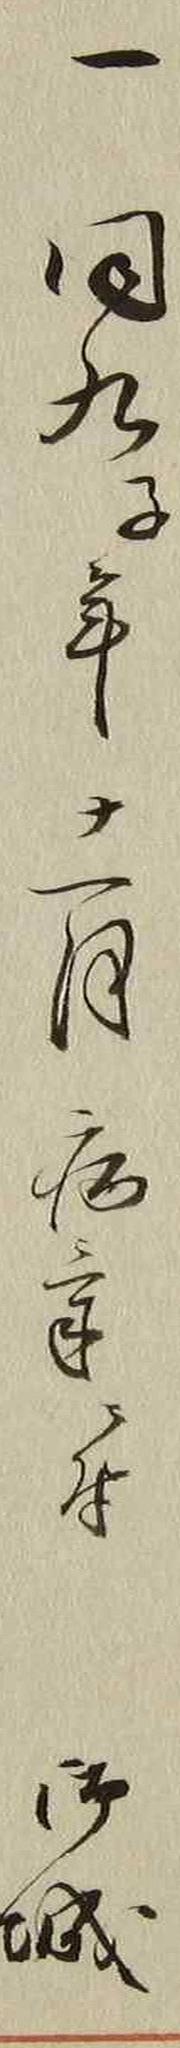一同九子年十一月病気ニ付
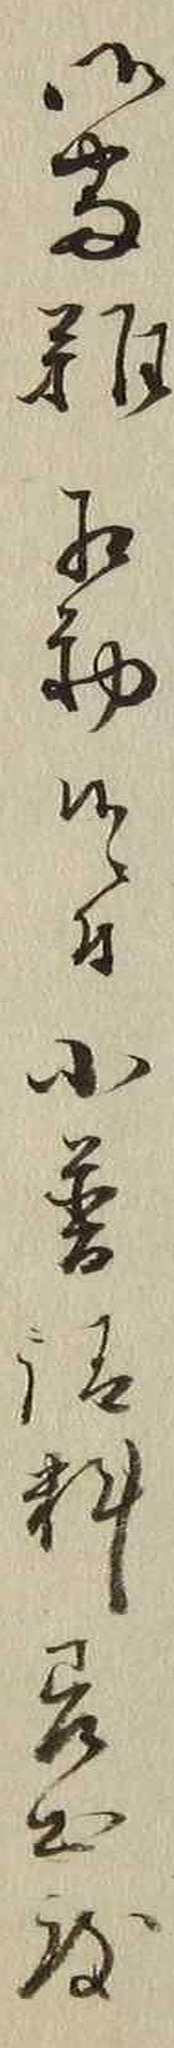御番難相勤候ニ付小普請料差出度
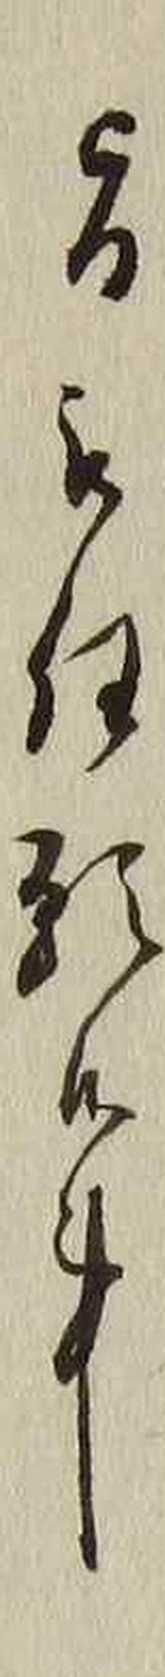旨被任願候事
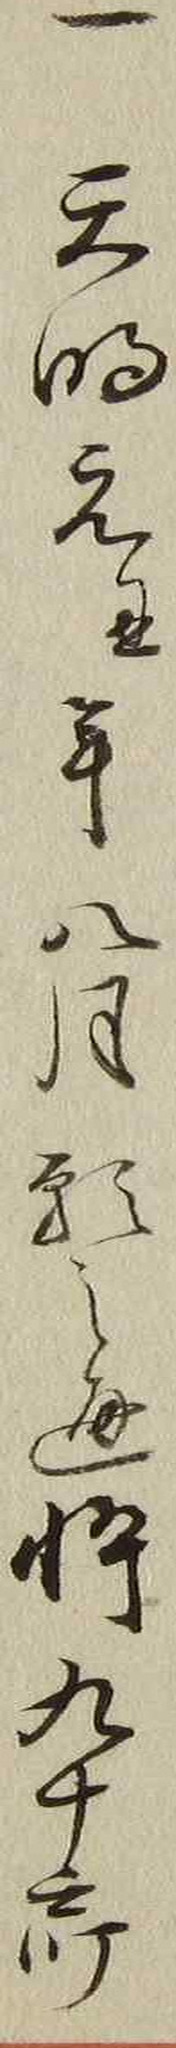一天明元丑年八月願之通忰九十郎
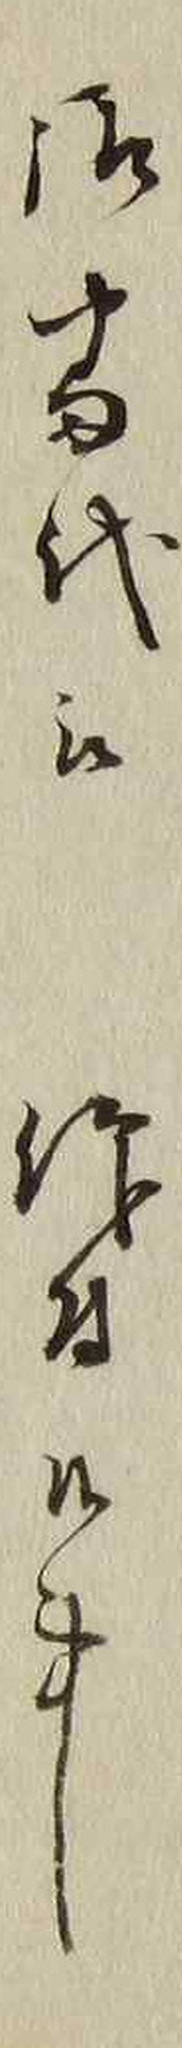御番代被仰付候事
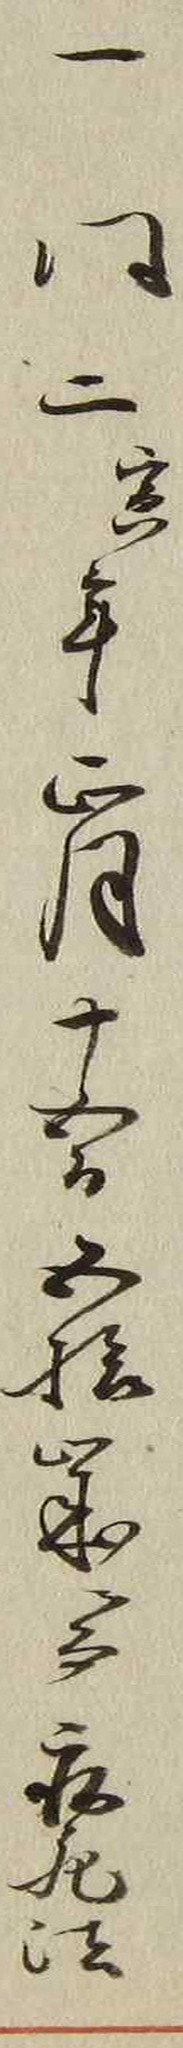一同二寅年正月十五日五拾歳ニ而病死法
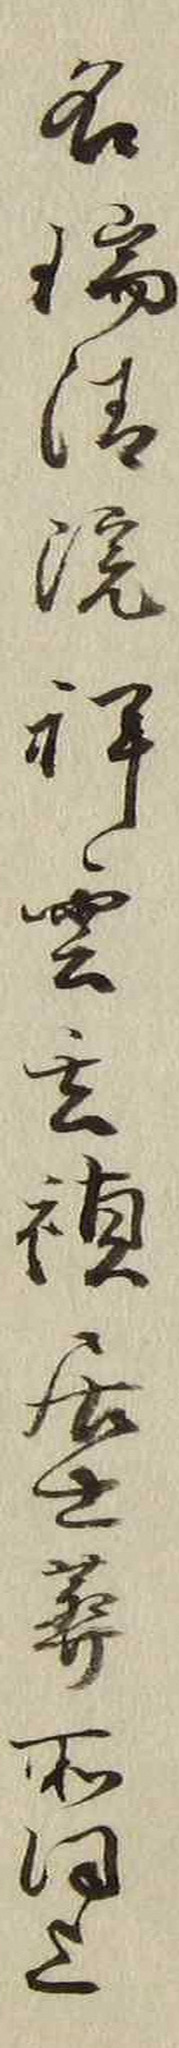名瑞清院祥雲玄禎居士葬所同上

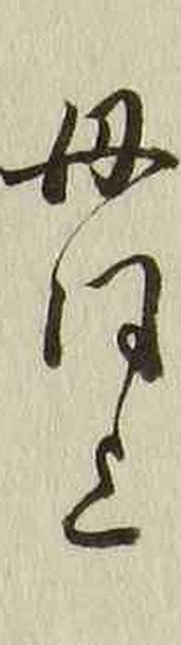母同上
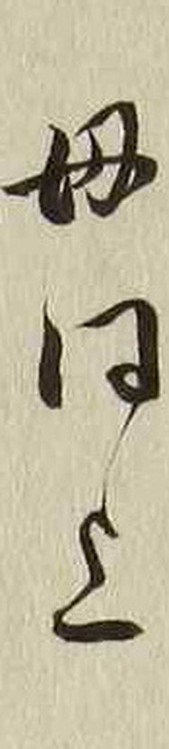母同上
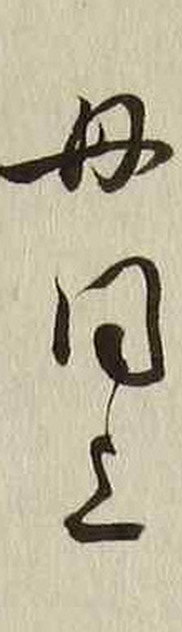母同上
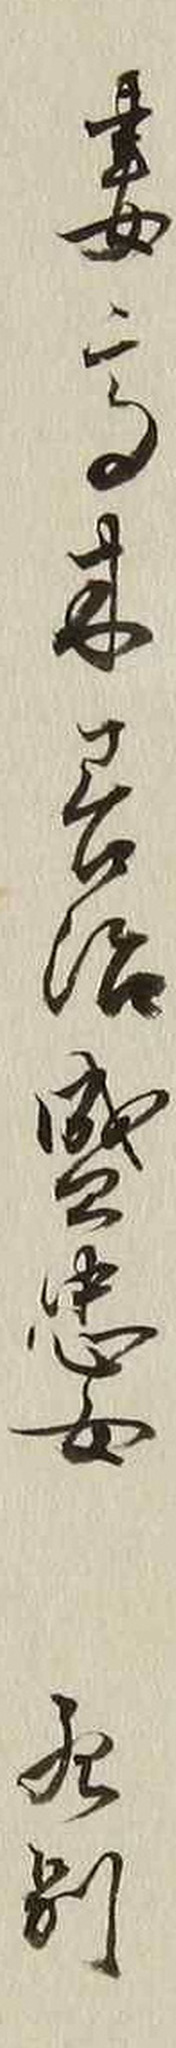妻高木善治盛忠女死別
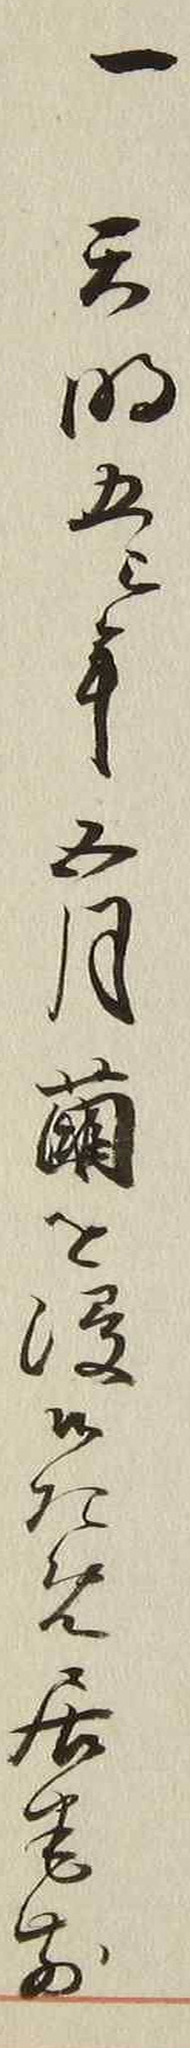一天明五巳年五月繭を浸候ため居宅前
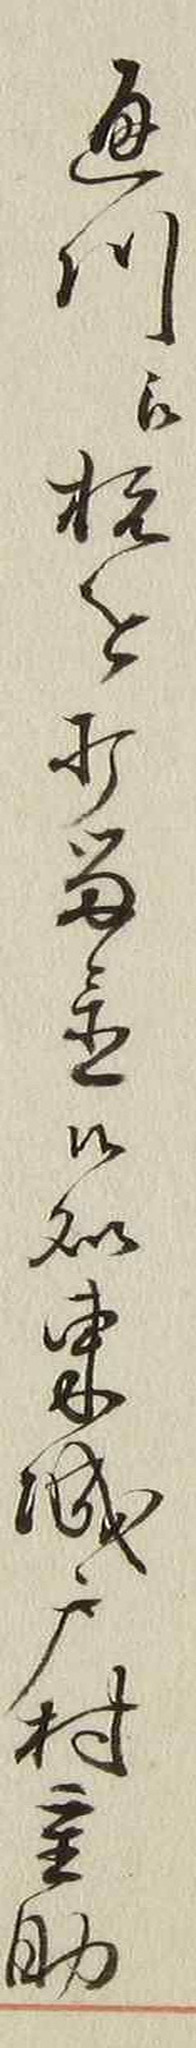通川江杭を打留置候処東城戸村重助
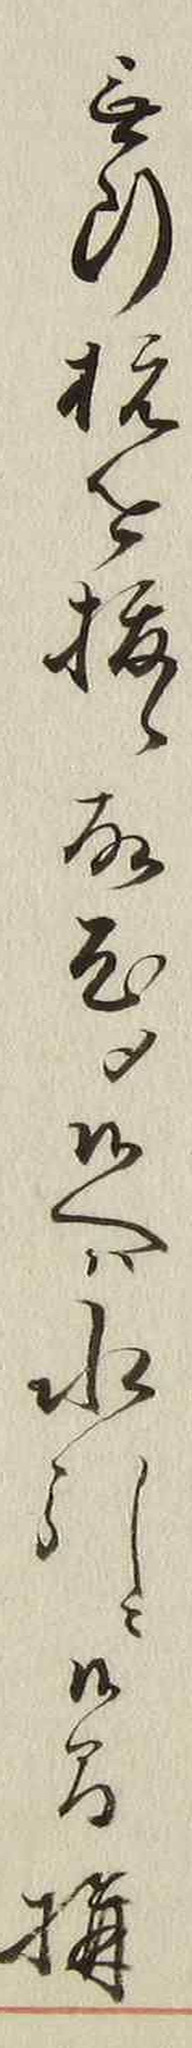無断杭を抜候故尤メ候へㇵ水引ニ候間構
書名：諸士系譜　巻之26　い之部26
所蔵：会津若松市立会津図書館
